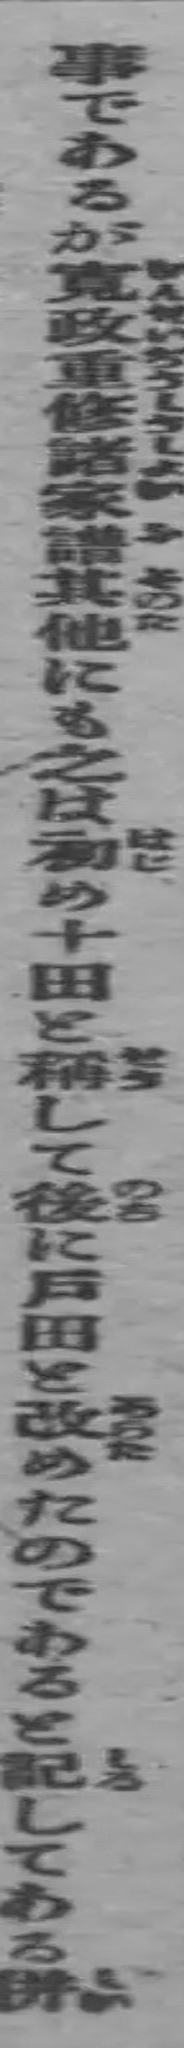十田と戸田事であるが寛政重修諸家譜其他にも之は初め十田と称して後に戸田と改めたのであると記してある併
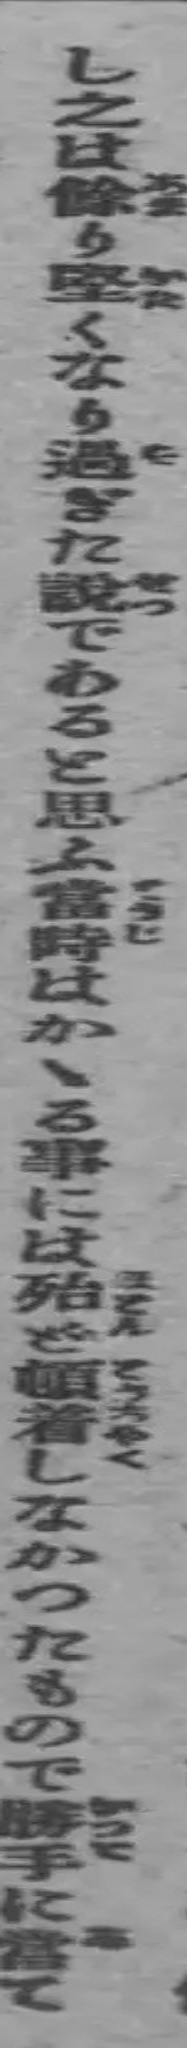し之は余り堅くなり過ぎた説であると思ふ当時はかゝる事には殆ど頓着しなかつたもので勝手に当て
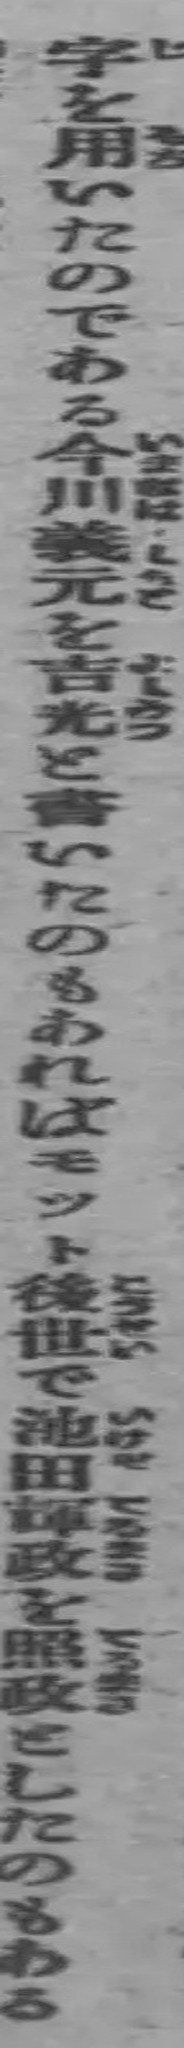字を用いたのである今川義元を吉光と書いたのもあればモツト後世で池田輝政を照政としたものもある
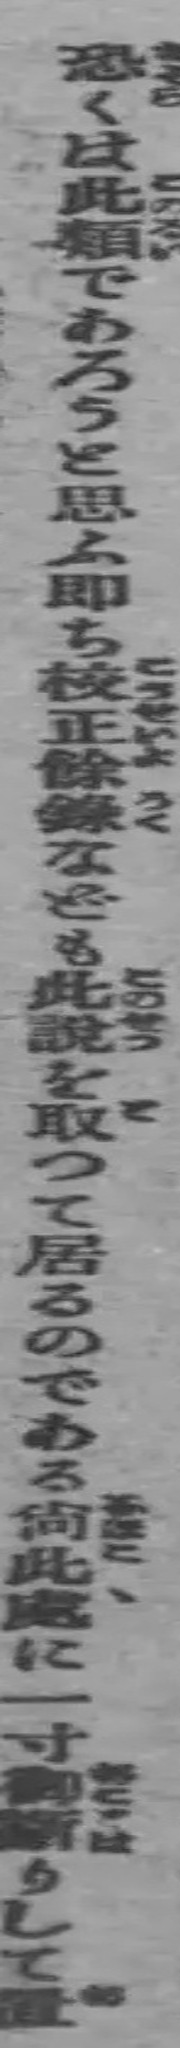恐くは此類であろうと思ふ即ち校正余録なども此説を取つて居るのである尚此処に一寸御断りして置
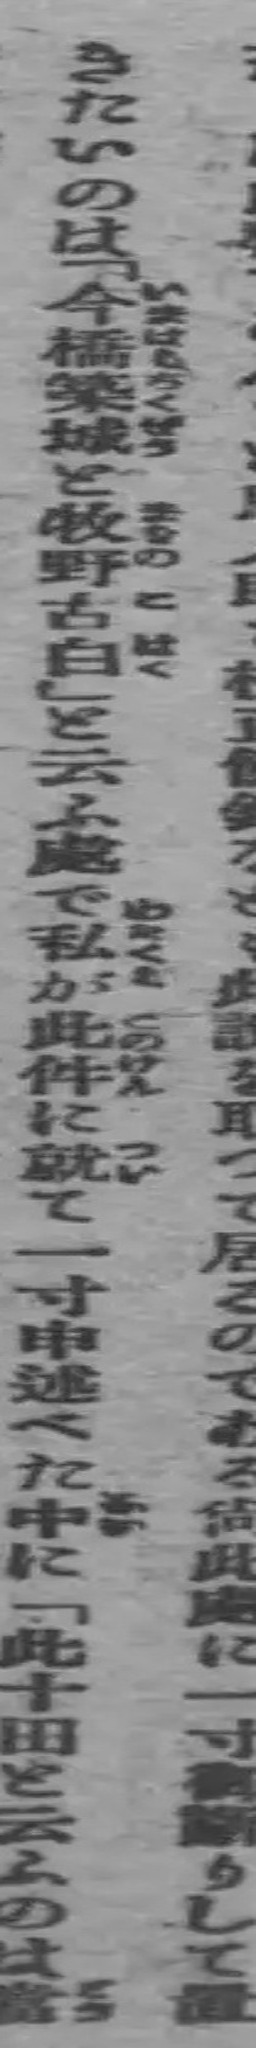きたいのは「今橋築城と牧野古白」と云ふ処で私が此件に就て一寸申述べた中に「此十田と云ふのは当
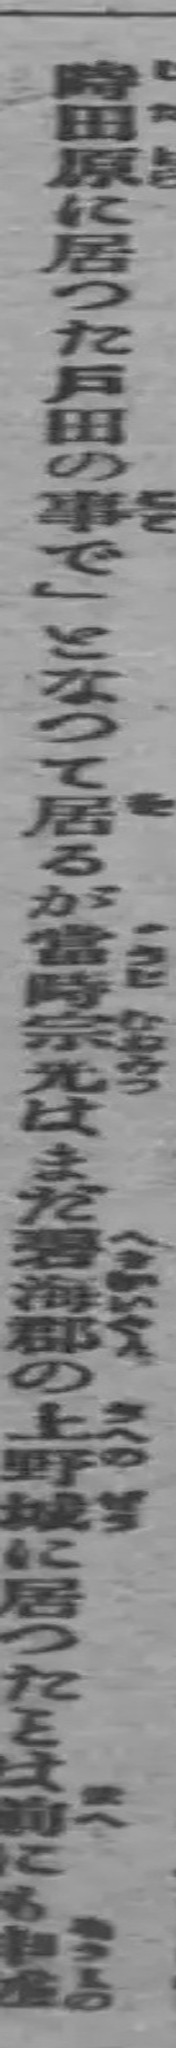時田原に居つた戸田の事で」となつて居るが当時宗光はまだ碧海郡の上野城に居つたことは前にも申述
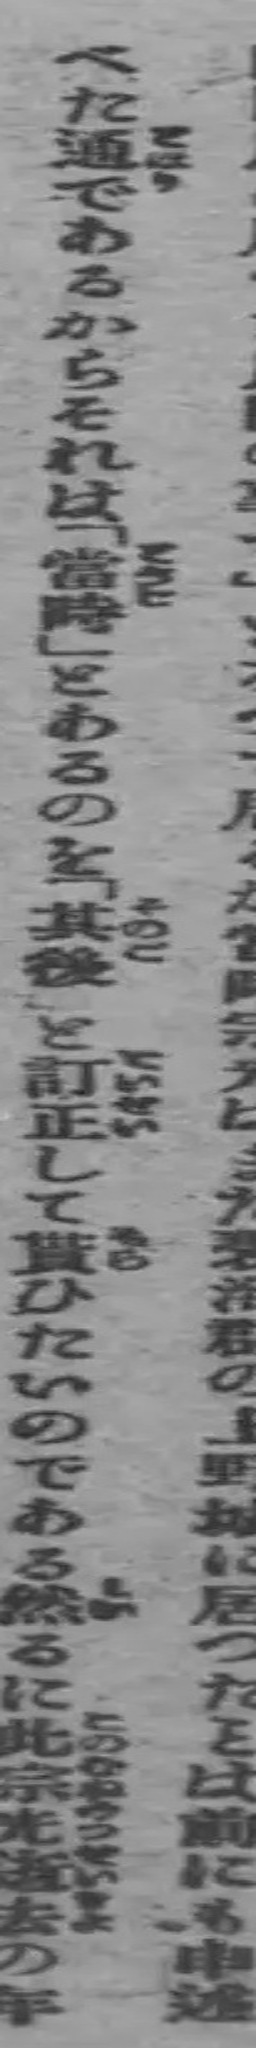べた通りであるからそれは「当時」とあるのを「其後」と訂正して貰ひたいのである然るに此宗光逝去の年
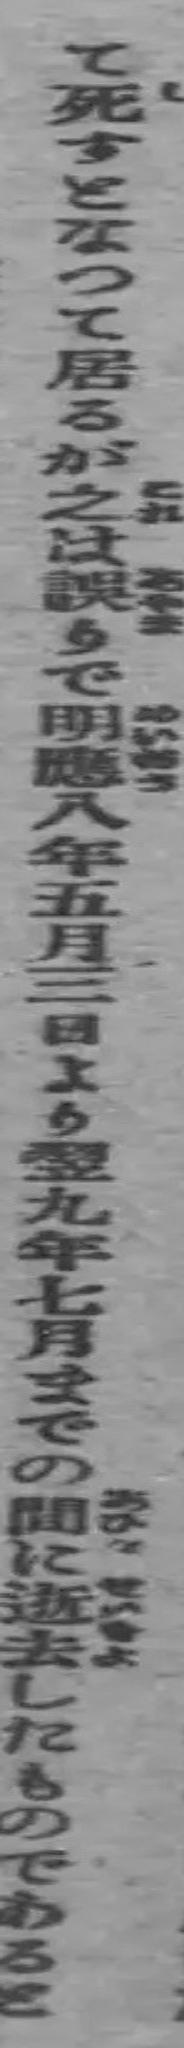て死すとなつて居るが之は誤りで明応八年五月三日より翌九年七月までの間に逝去したものであると
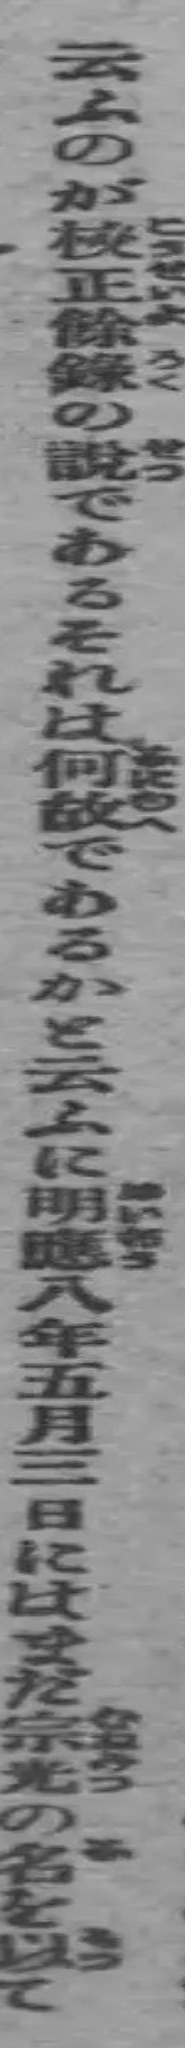云ふのが校正余録の説であるそれは何故であるかと云ふに明応八年五月三日にはまだ宗光の名を以て
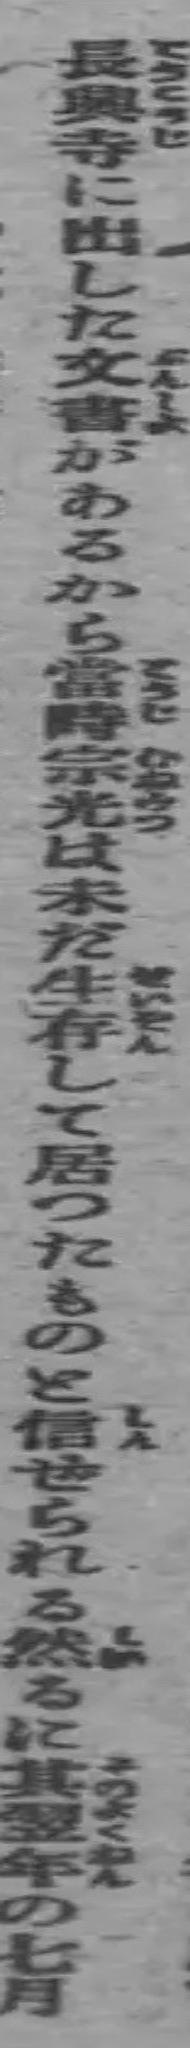長興寺に出した文書があるから当時宗光は未だ生存して居つたものと信ぜられる然るに其翌年の七月
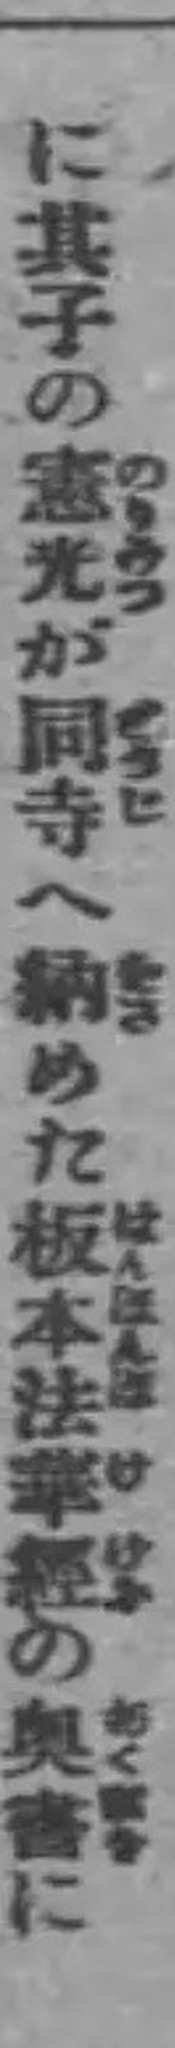に其子の憲光が同寺へ納めた板本法華経の奥書に
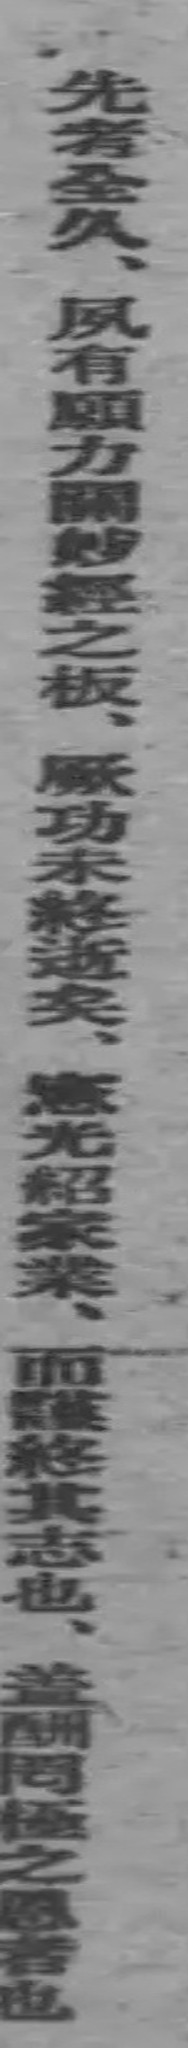先者全久、夙有願力関妙経之板、厥功末終逝矣、憲光紹家業、而護終其志也、盖酬罔極之恩者也
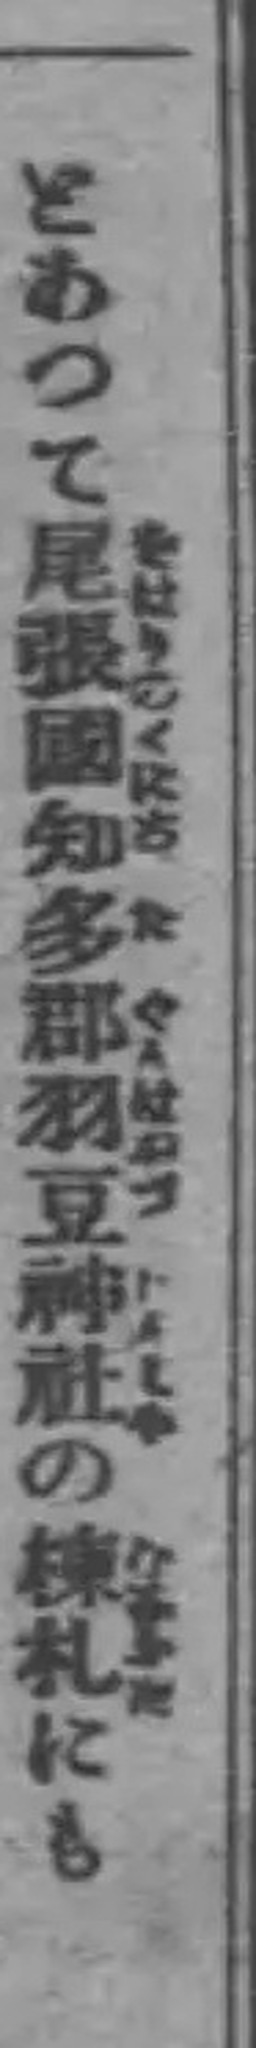とあつて尾張国知多郡羽豆神社の棟札にも
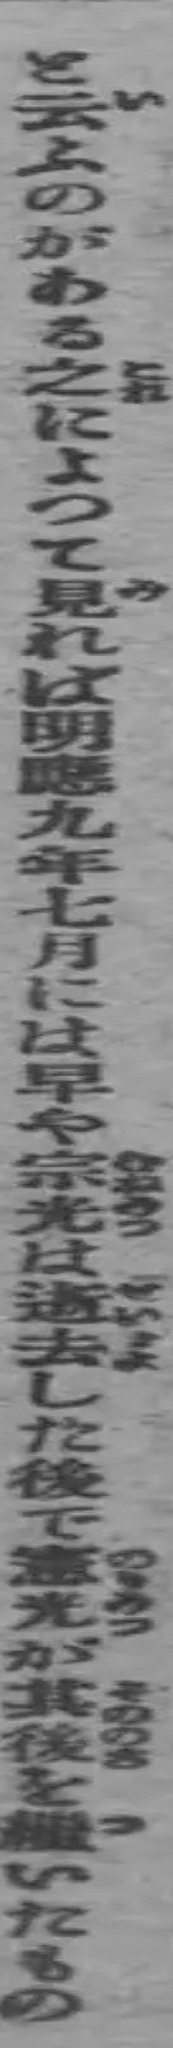と云ふのがある之によつて見れば明応九年七月には早や宗光は逝去した後で憲光が其後を継いたもの
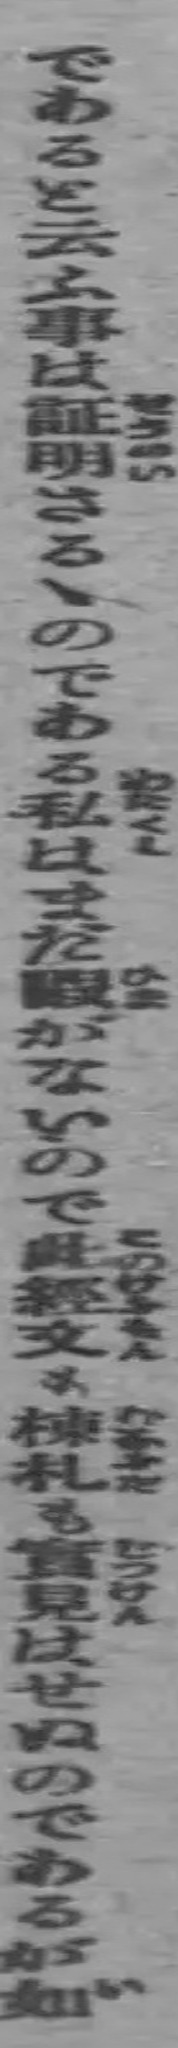であると云ふ事は証明さるゝのである私はまだ暇がないので此経文も棟札も実見はせぬのであるが如
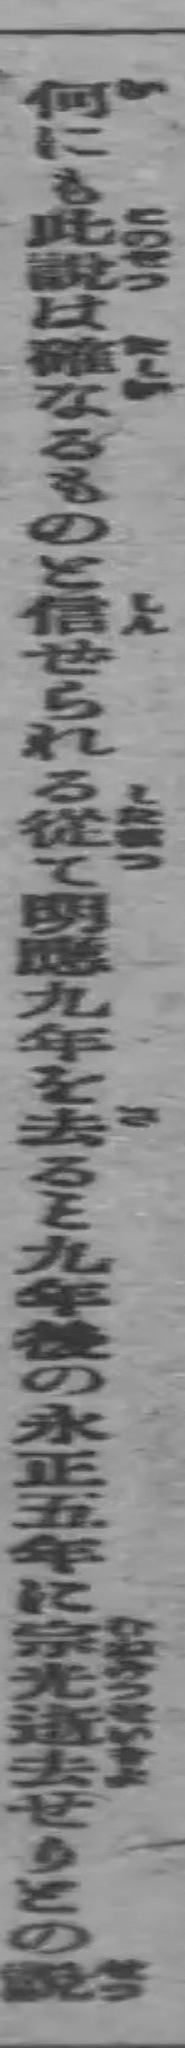何にも此説は確なるものと信ぜられる従て明応九年を去ること九年後の永正五年に宗光逝去せりとの説
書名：豊橋市史談
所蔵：国立国会図書館 National Diet Library, JAPAN
